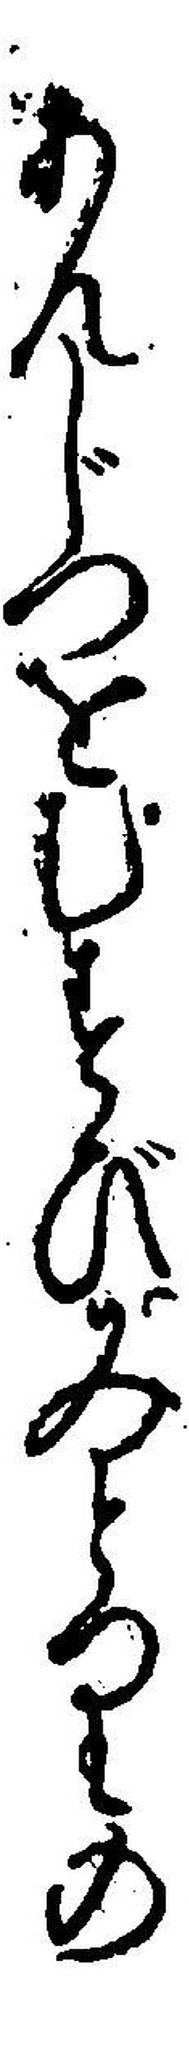あんじつをむすび。みとりの
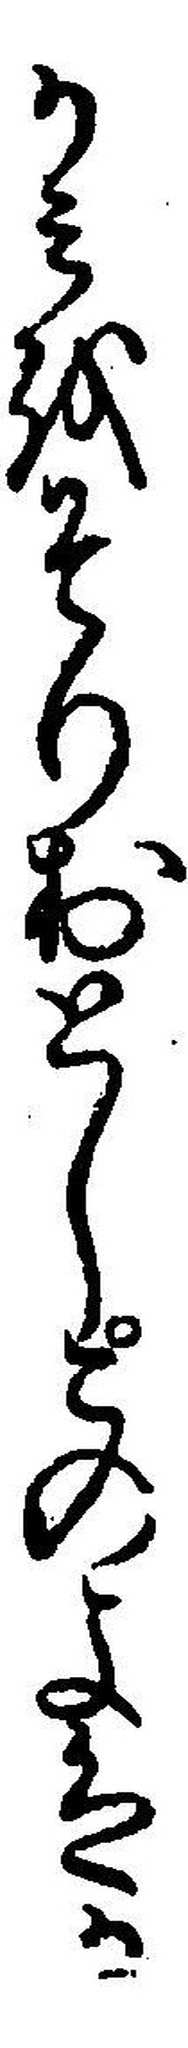かみをそりおとし。このよはか
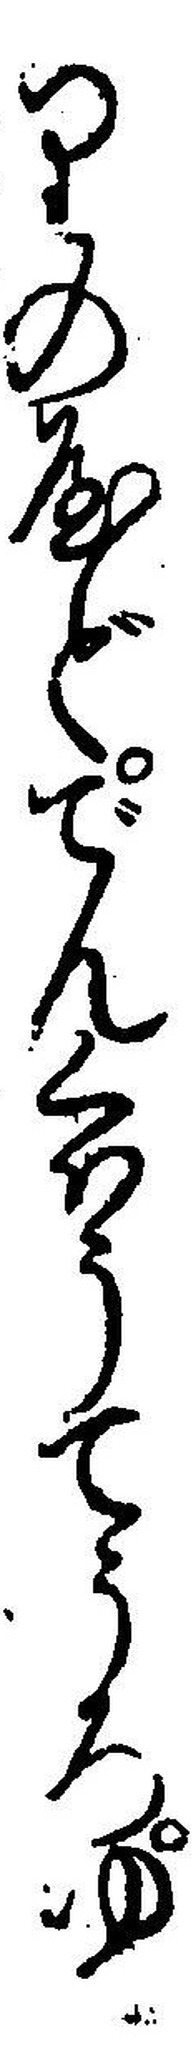りのやど。でんくはうてうろ。ゆ
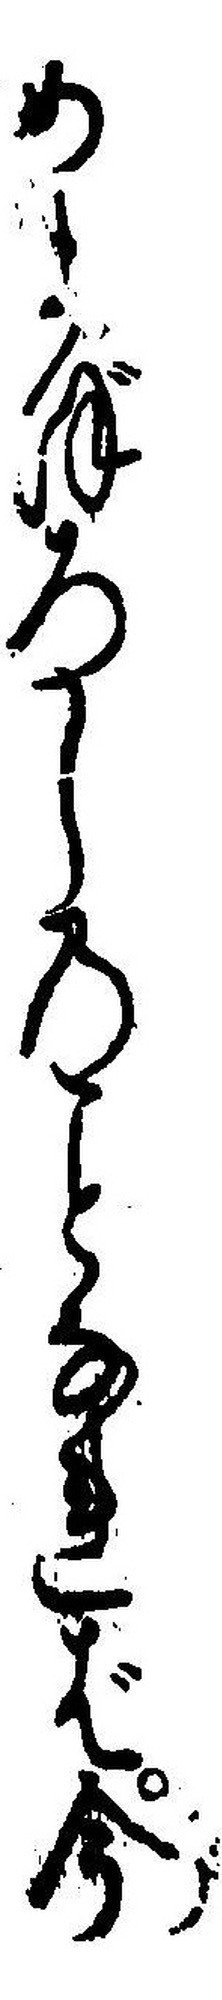めまぼろしのことなれば。今
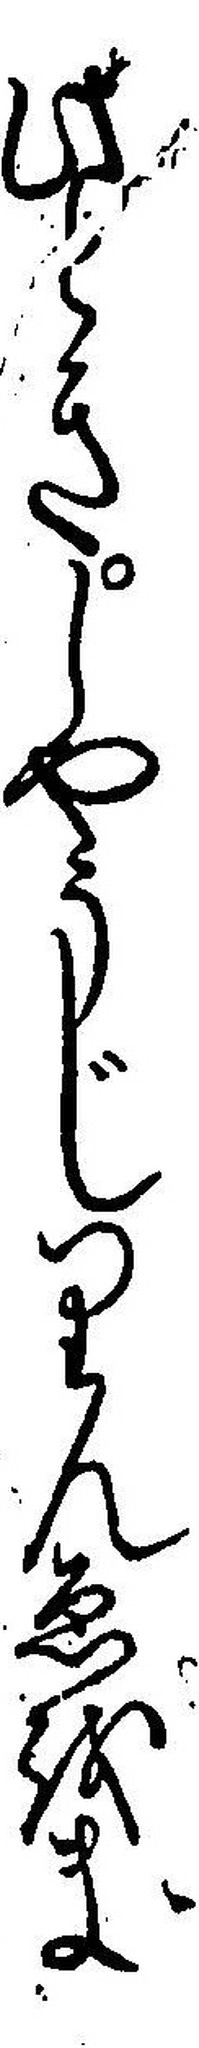此とき。しやうじりんゑをま
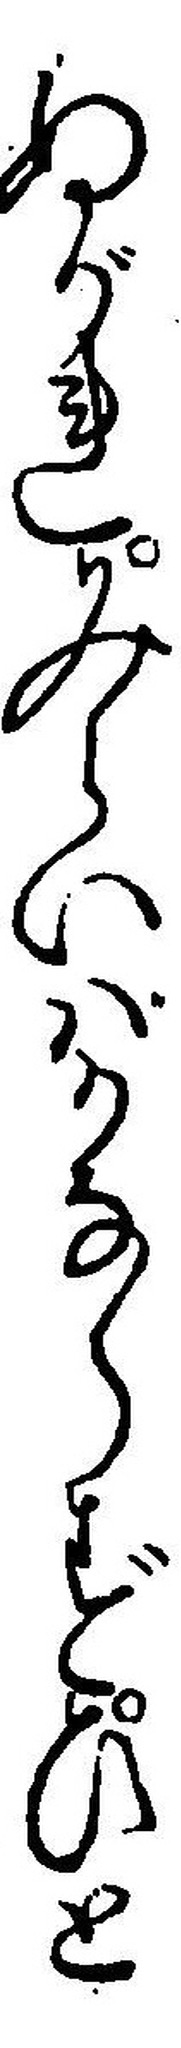ぬがれ。みらいはかならず。ひと
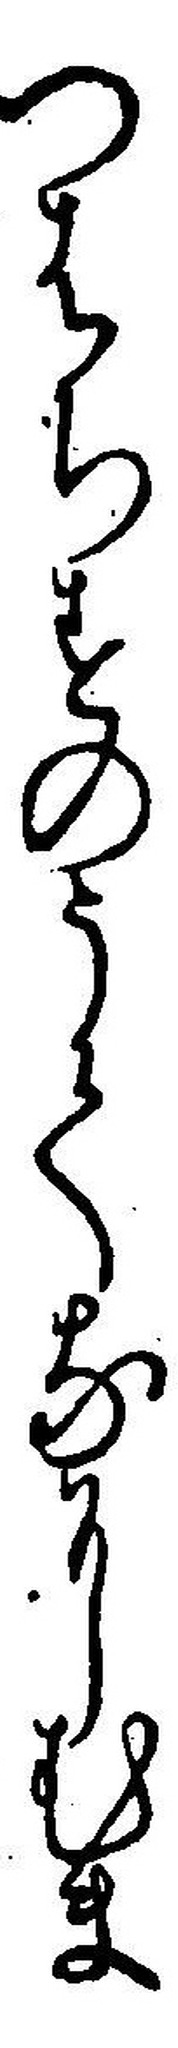つはちすのうてなにむま
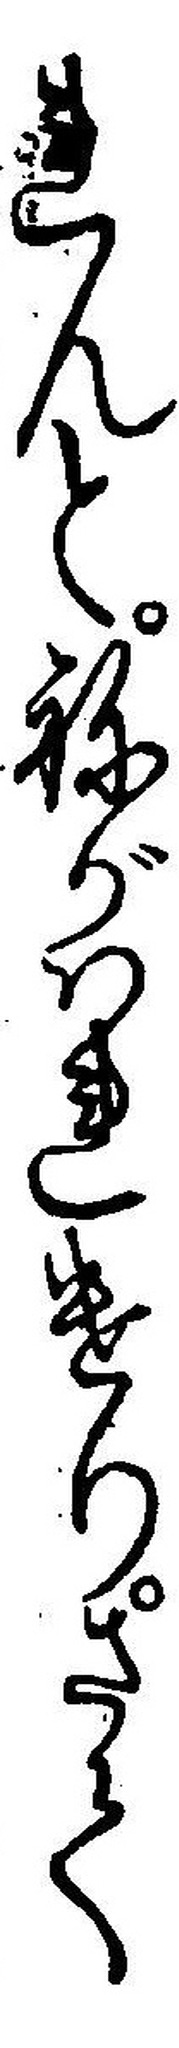れんと。ねがはれけり。さて
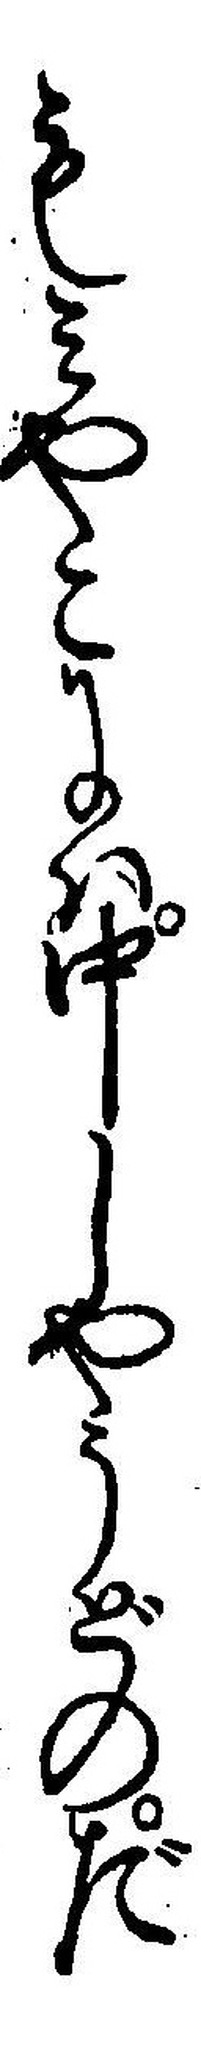もみやこには。中しやうどの。だ
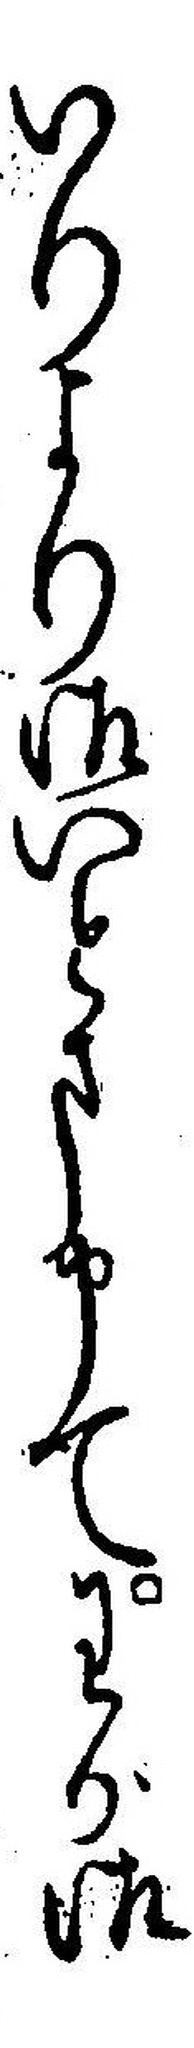いりより御いとま申て。わが御
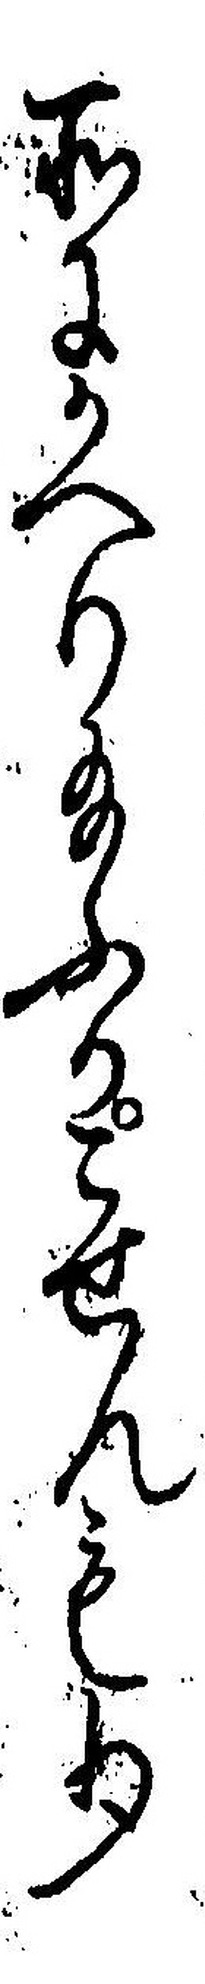所にかへり給ふか。こせんも少
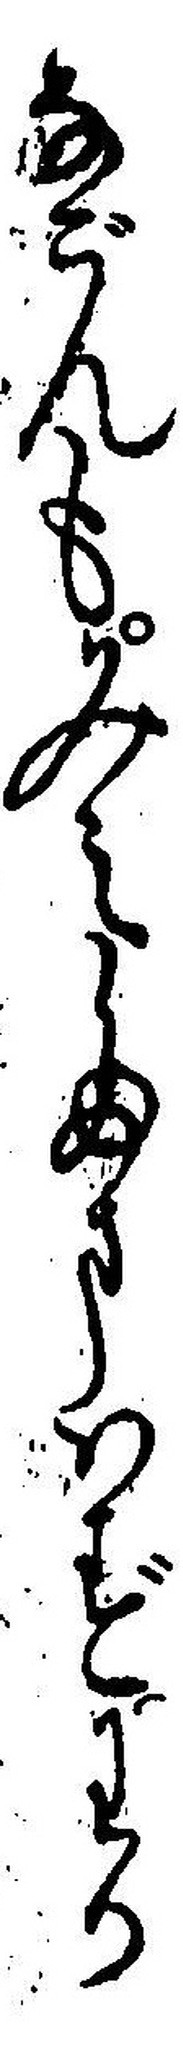なごんも。みえたまはず。わか
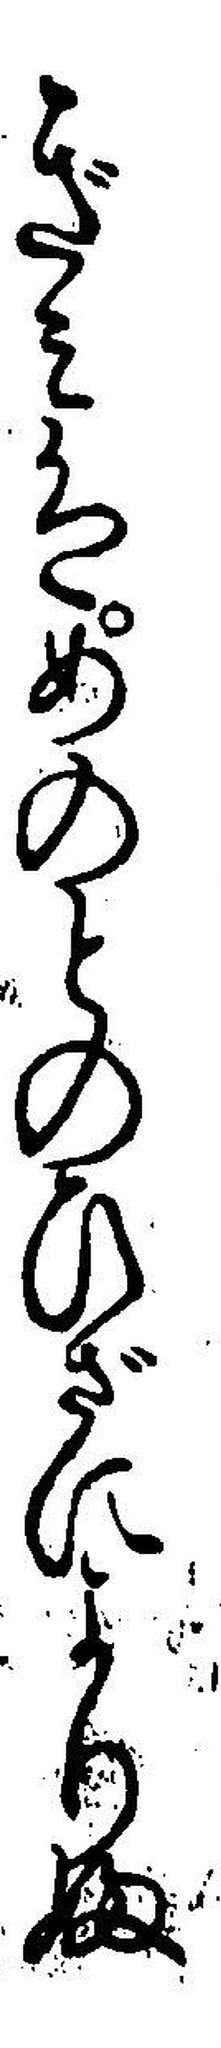ぎみは。めのとのひざによりふ
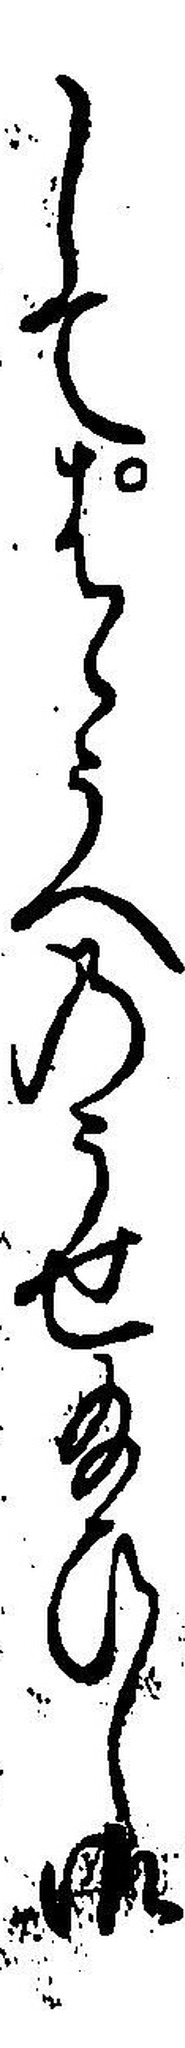して。はゝうへのうせ給ひし御
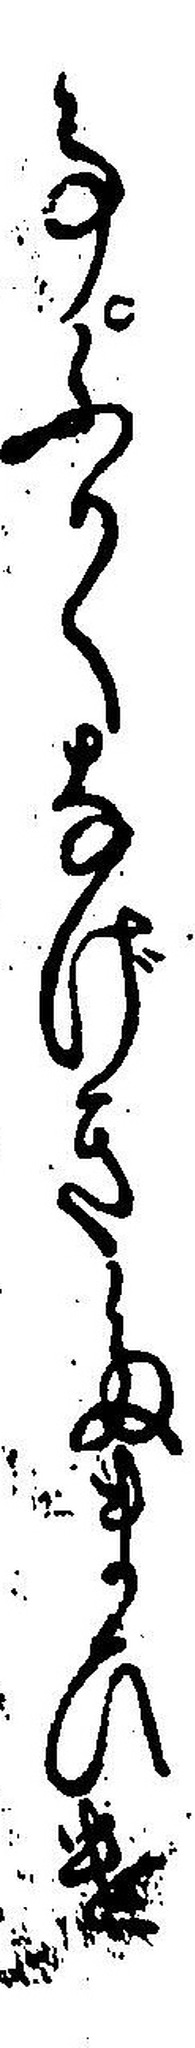事。ふかくなげきたまひけ
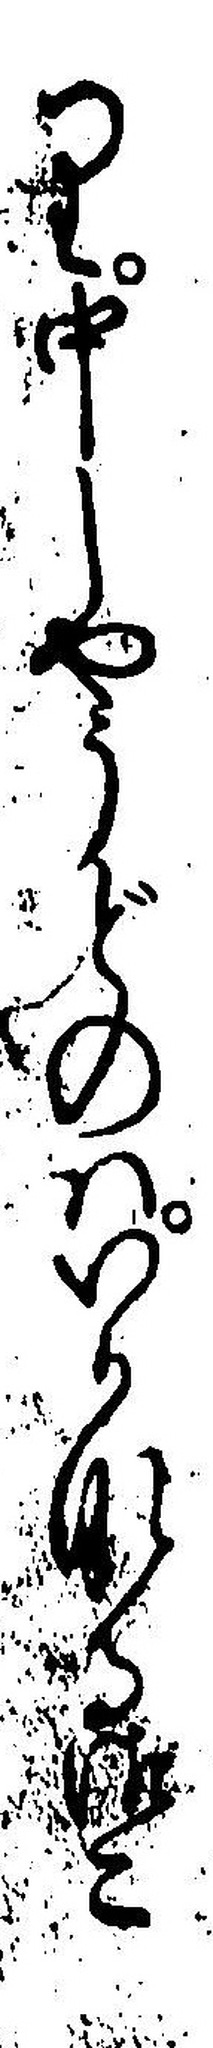り。中しやうどのは。いかなる御こ
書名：木幡きつね
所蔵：東京大学総合図書館 General Library in the University of Tokyo, JAPAN
